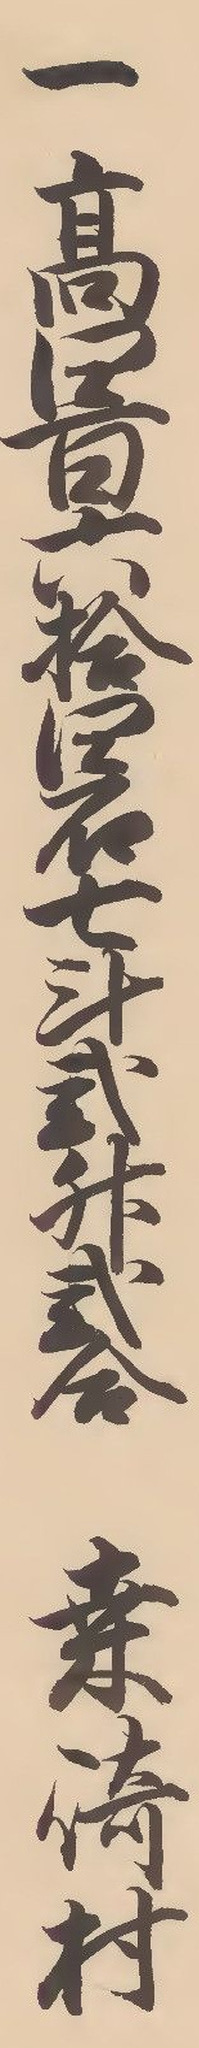一高四百六拾四石七斗弐升弐合桑崎村

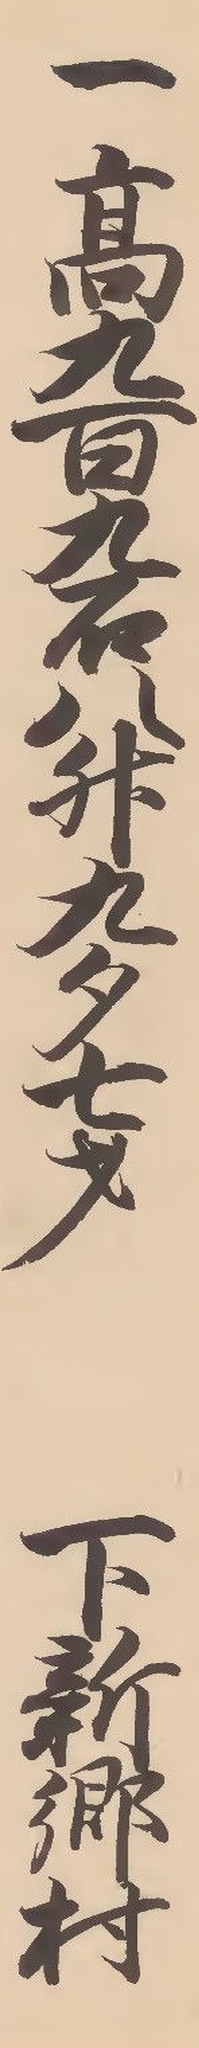一高九百九石八升九勺七才下新郷村
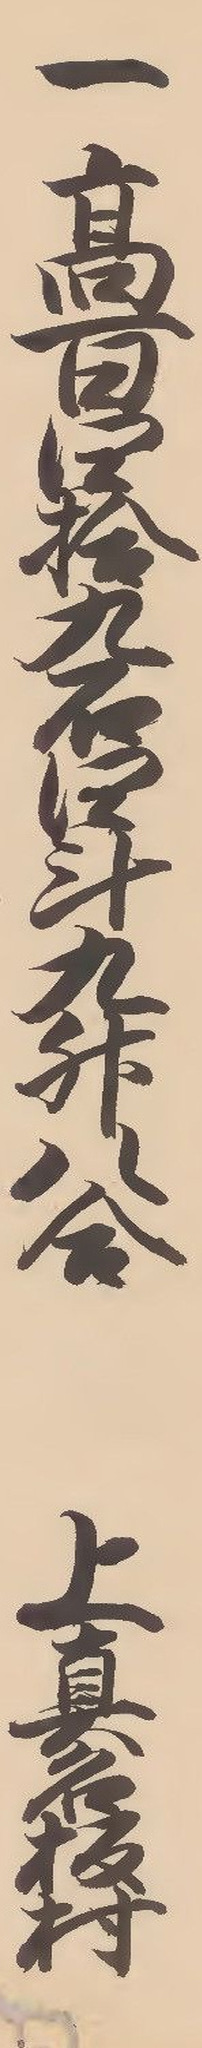一高百四拾九石四斗九升八合上真名板村
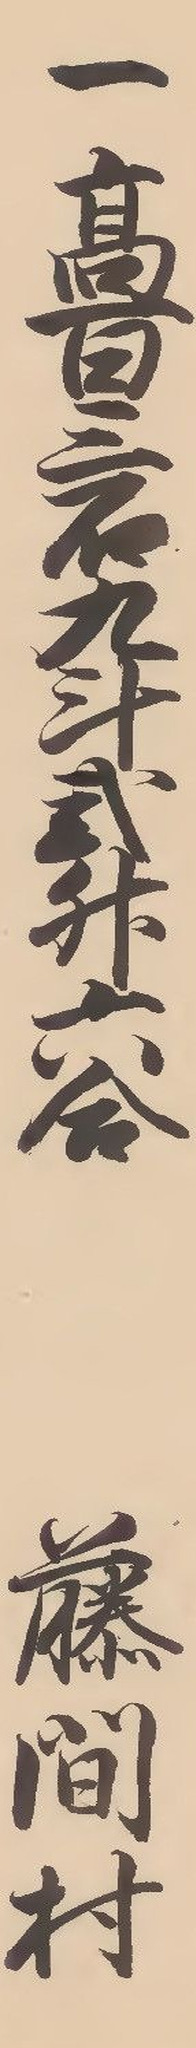一高百三石九斗弐升六合藤間村
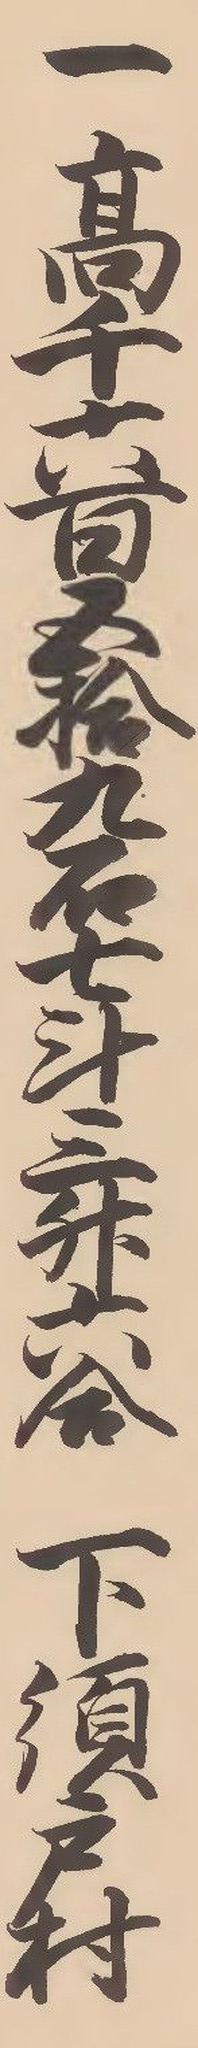一高千六百五拾九石七斗三升六合下須戸村
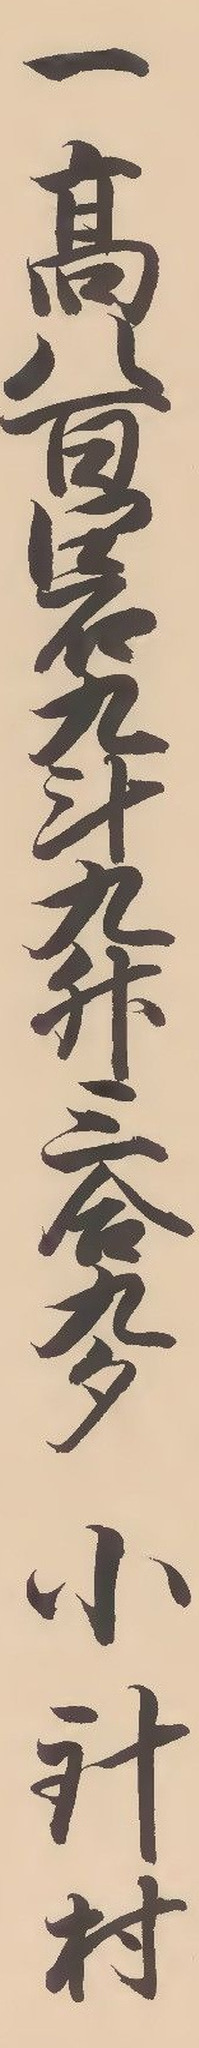一高八百四石九斗九升三合九勺小針村
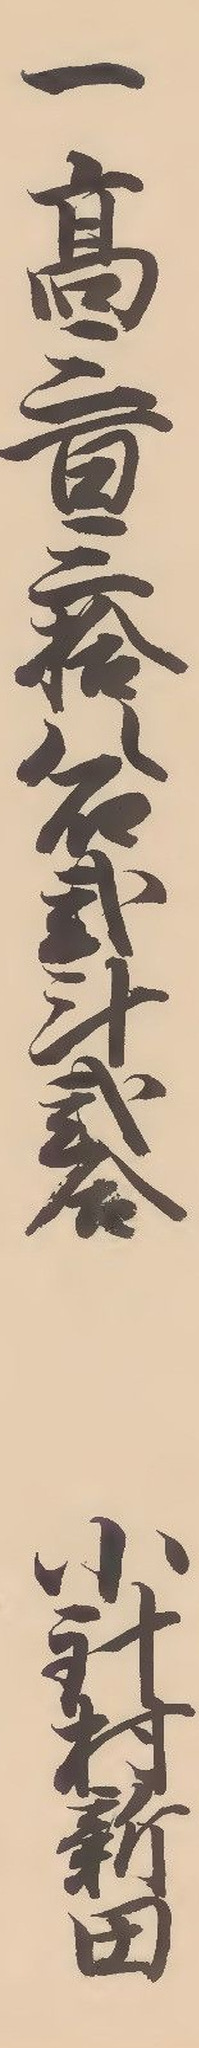一高三百三拾八石弐斗弐合小針村新田
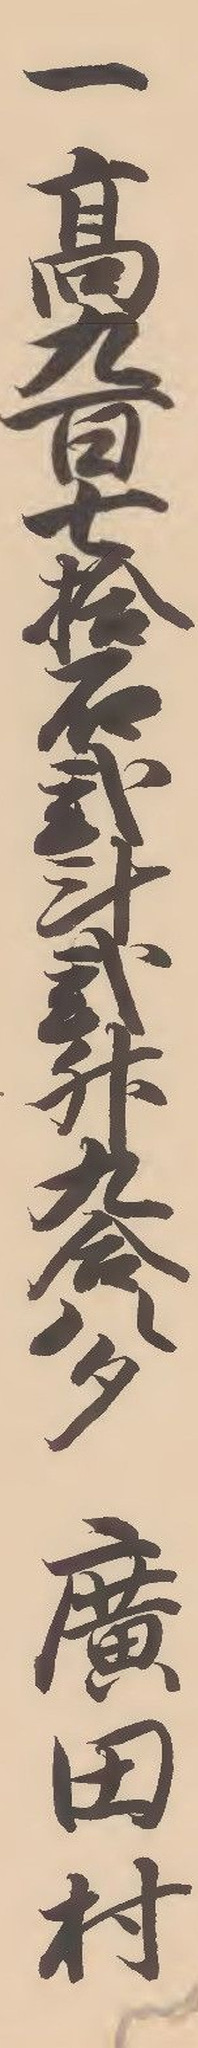一高九百七拾石弐斗弐升九合八勺広田村
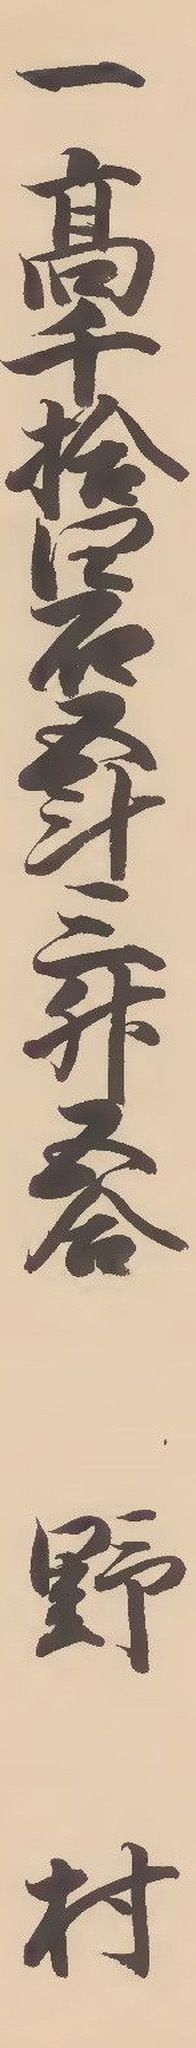一高千拾四石五斗三升五合野村

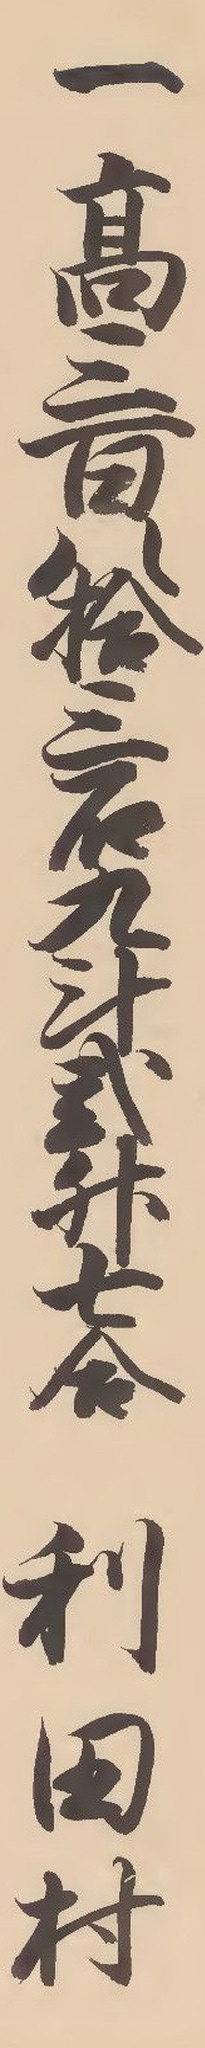一高三百八拾三石九斗弐升七合利田村
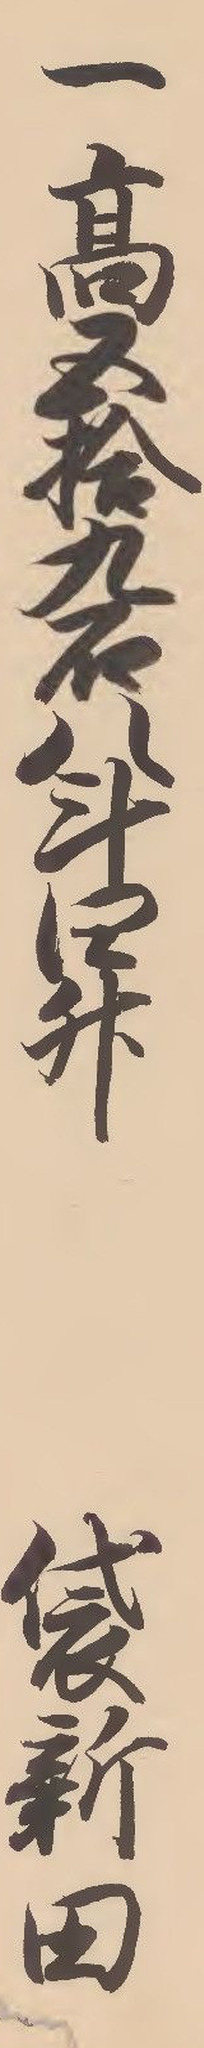一高五拾九石八斗四升袋新田
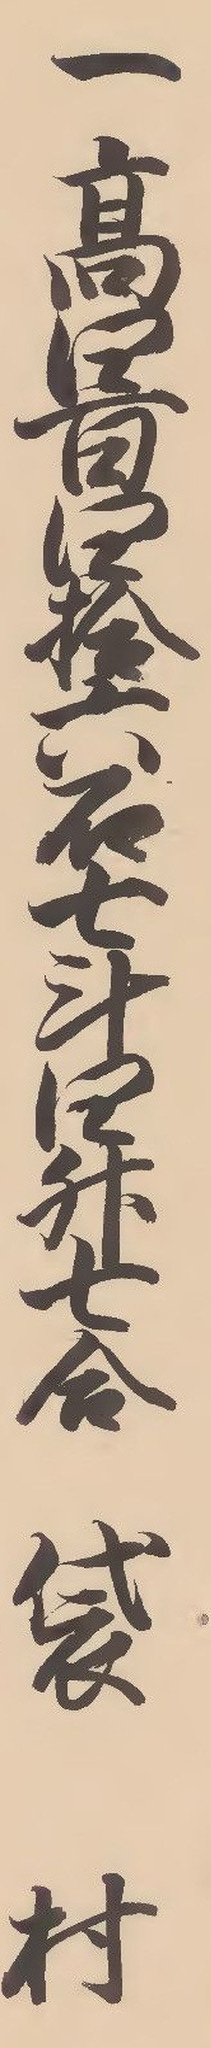一高四百四拾六石七斗四升七合袋村
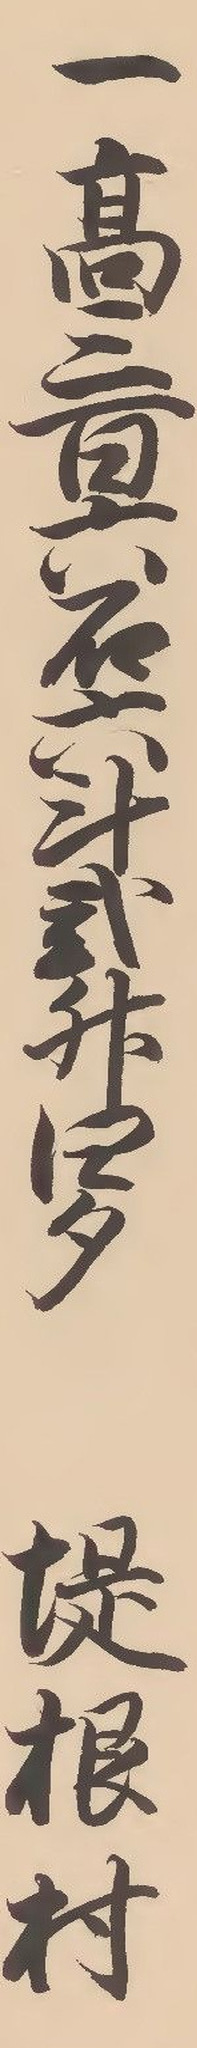一高三百六石六斗弐升四勺堤根村
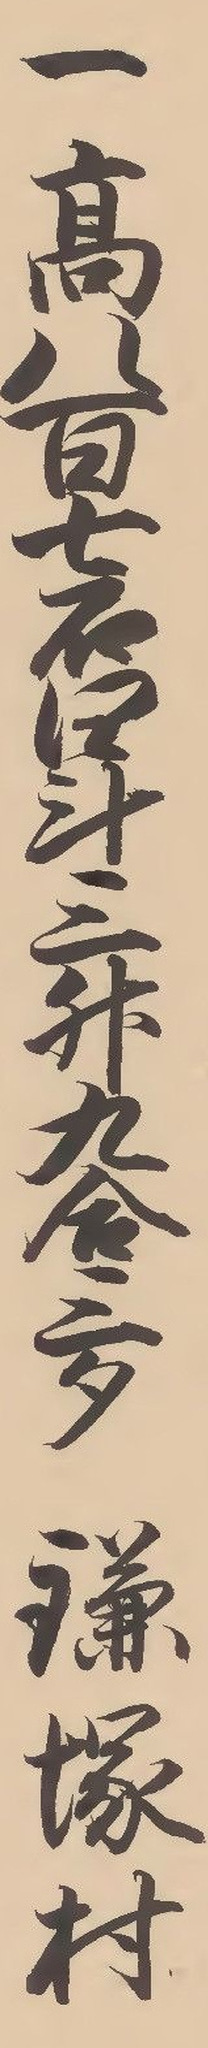一高八百七石四斗三升九合三勺鎌塚村
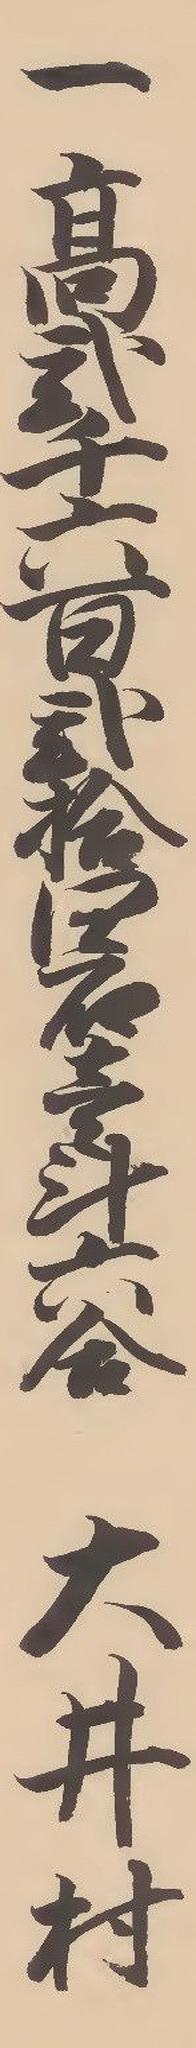一高弐千六百弐拾四石壱斗六合大井村
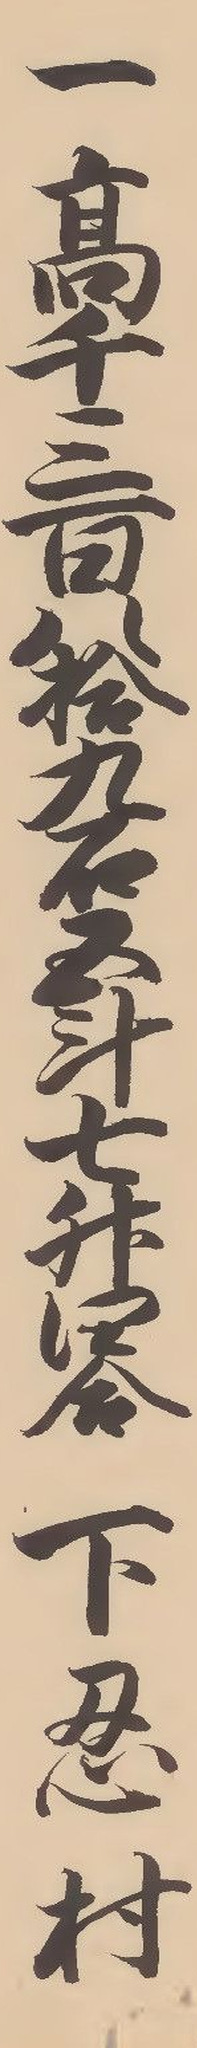一高千三百八拾九石五斗七升四合下忍村
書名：武蔵国郷帳　下
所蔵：国立公文書館 National Archives of Japan
